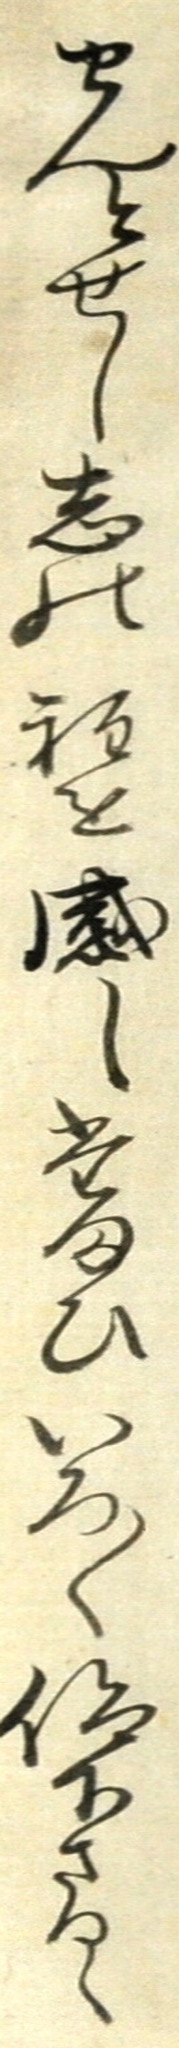せんとせし志の程を感したまひいろ〳〵仰下さるゝ

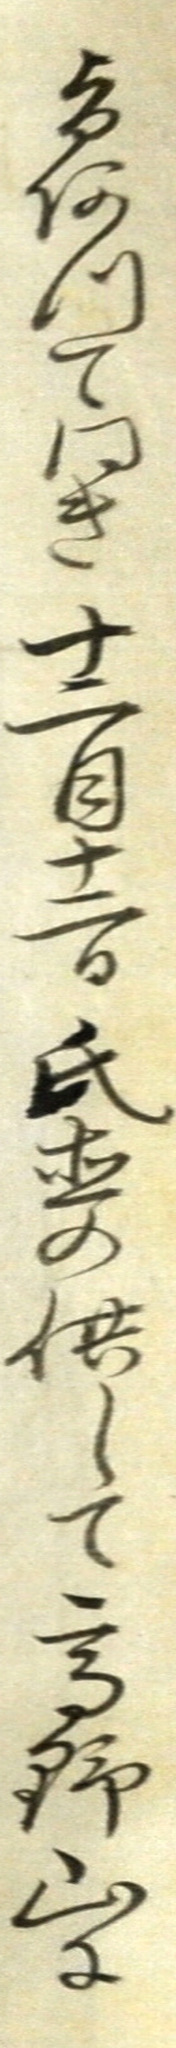旨あつて同き十二月十二日氏直の供して高野山に
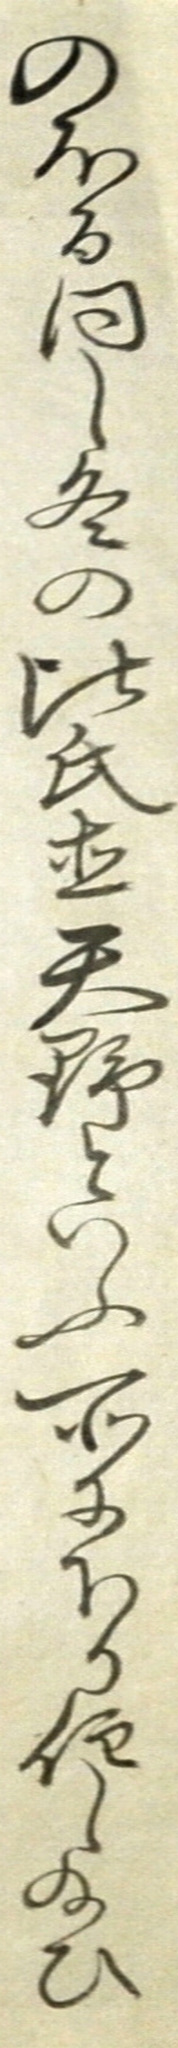のほる同し冬の比氏直天野といふ所に下り住し給ひ
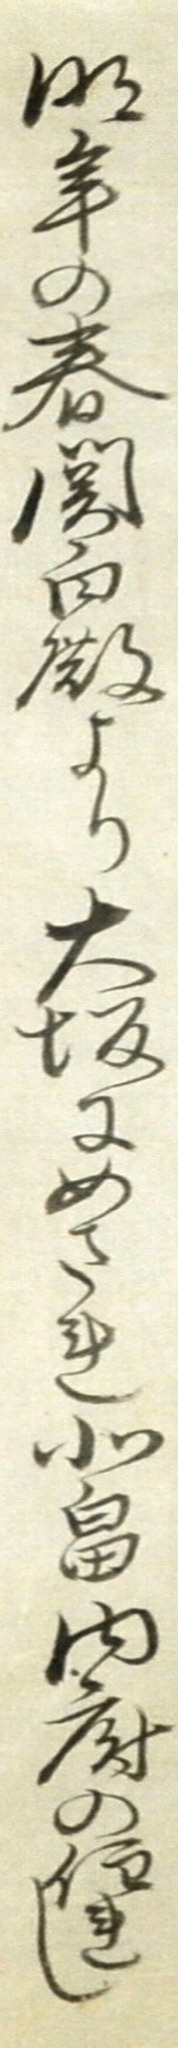明年の春関白殿より大坂にめされ北畠内府の住れし
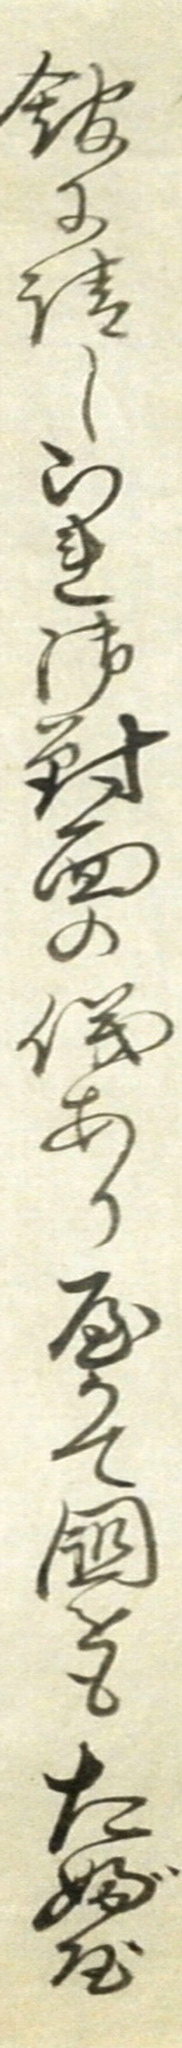館に請しられ御対面の儀ありやかて国をもたぶや
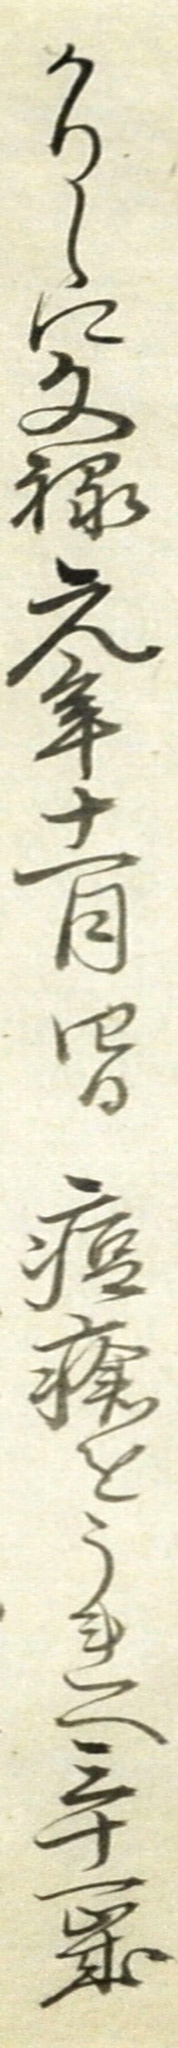かりしに文禄元年十一月四日痘瘡をうれへ三十一歳
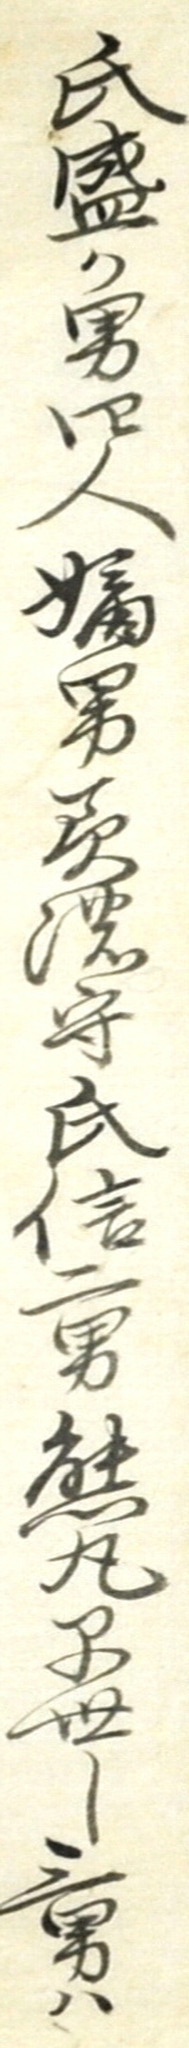氏盛か男四人嫡男美濃守氏信二男熊丸早世し三男は
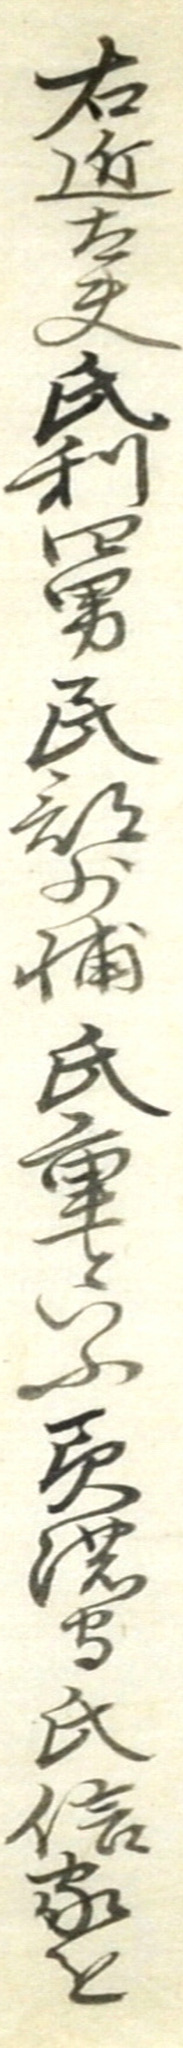右近太夫氏利四男民部少輔氏重といふ美濃守氏信家を
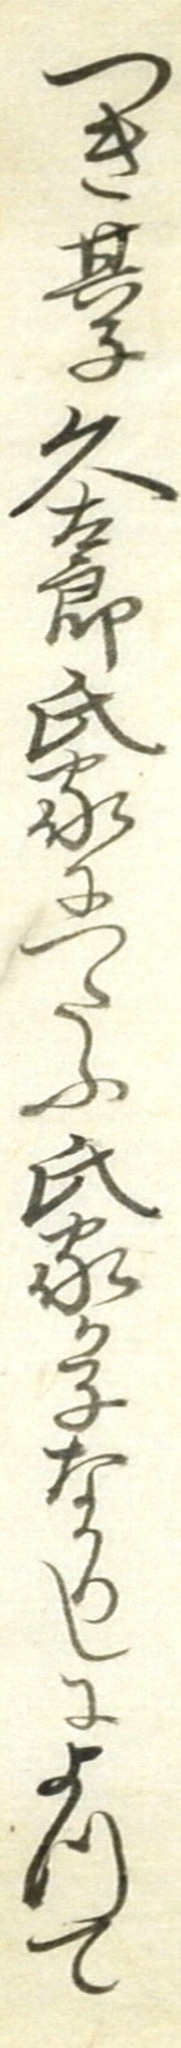つき其子久太郎氏家につたふ氏家か子なかりしによつて
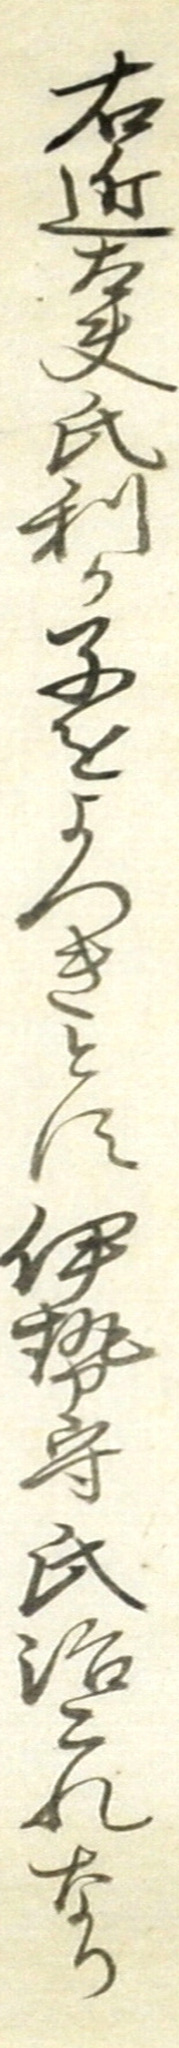右近太夫氏利か子をよつきとす伊勢守氏治これなり
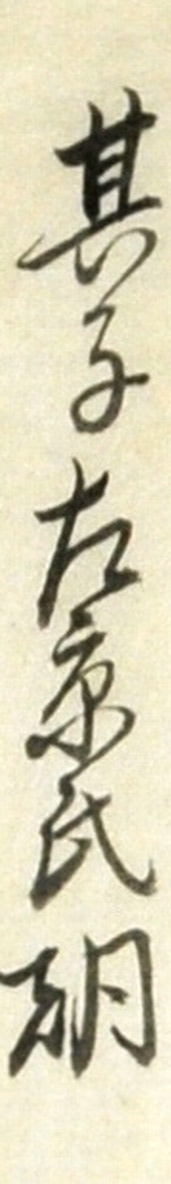其子左京氏朝

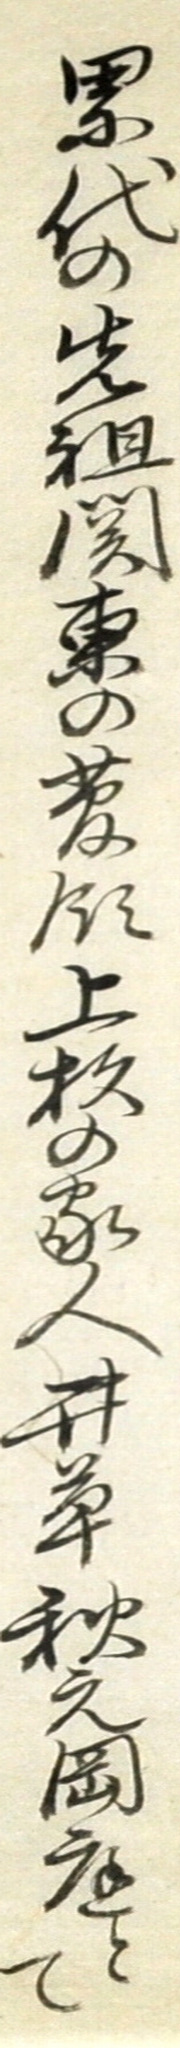累代の先祖関東の管領上杉の家人井草秋元岡庭とて
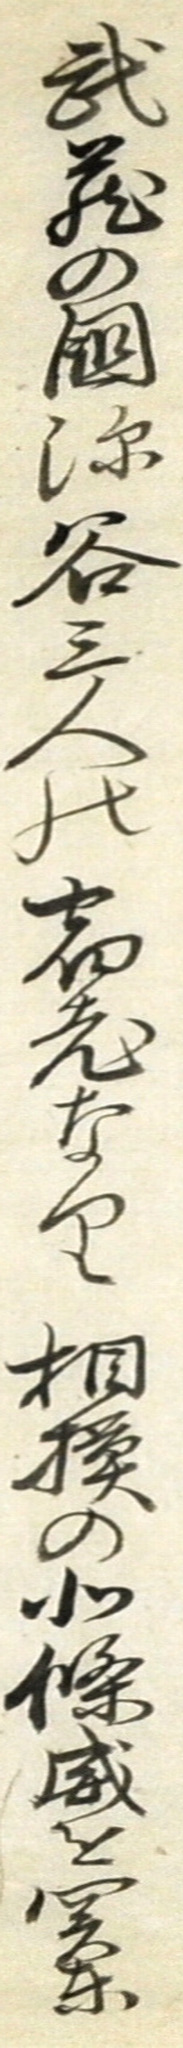武蔵の国深谷三人の宿老なり相模の北条威を関東
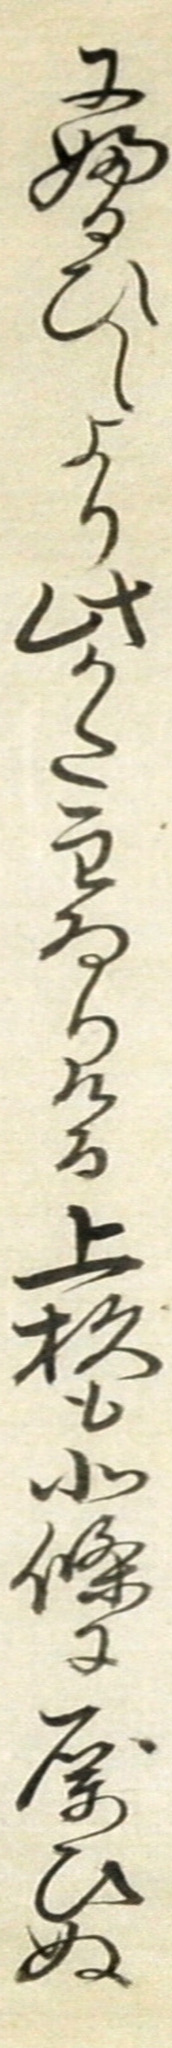にふるひしより此かた主なりける上杉も北条に属ひぬ
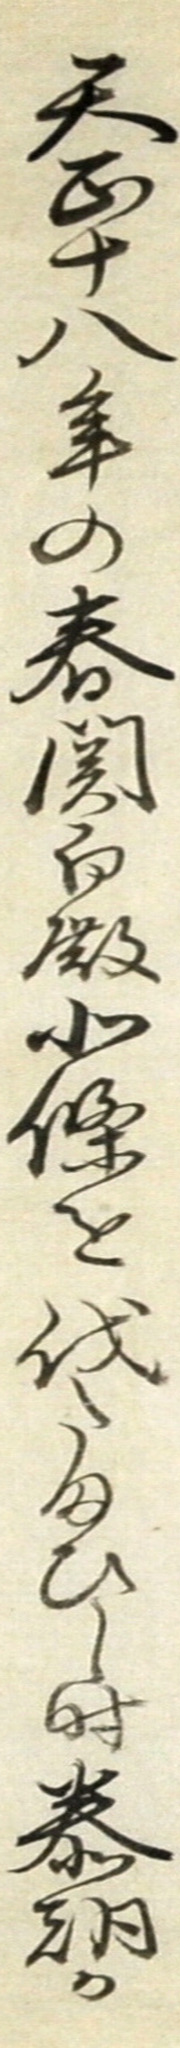天正十八年の春関白殿北条を伐たまひし時泰朝か
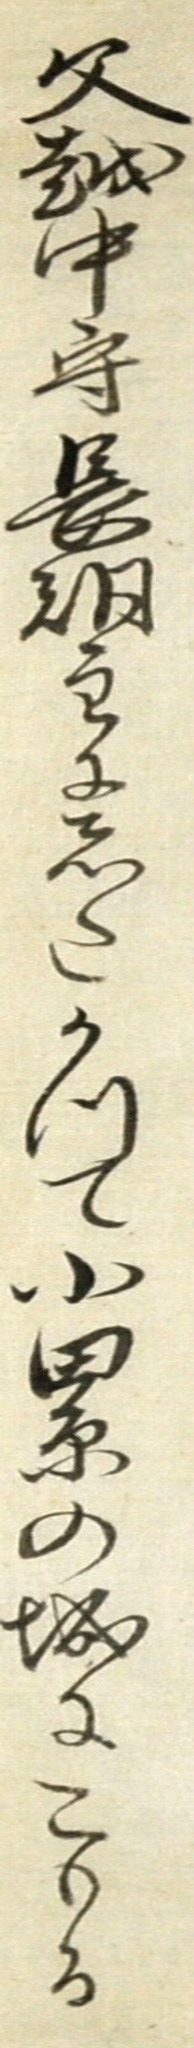父越中守長朝主にしたかつて小田原の城にこもる
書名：藩翰譜（六）
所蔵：伊那市立高遠町図書館・合同会社AMANE
